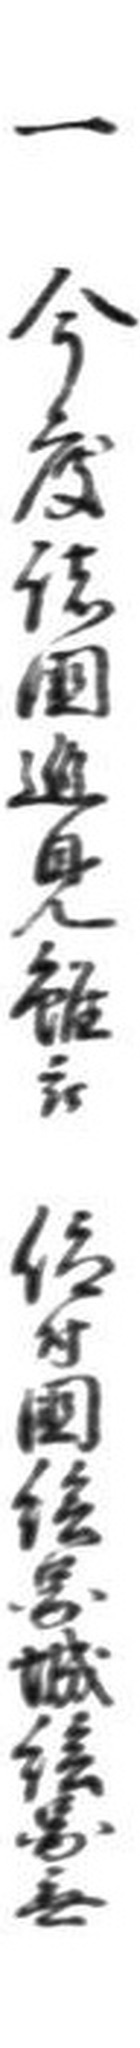一今度諸国巡見雖被仰付国絵図城絵図無
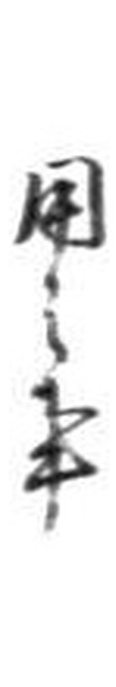用之事
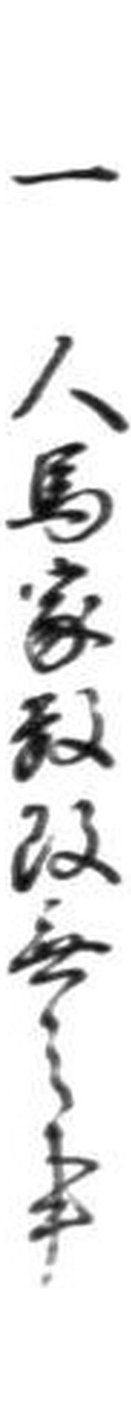一人馬家数改無之事
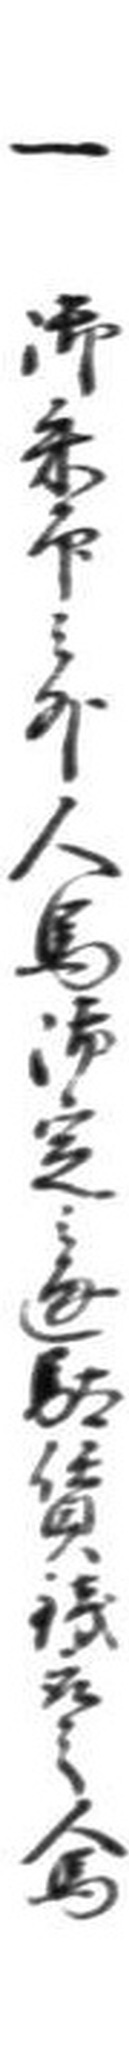一御朱印之外人馬御定之通駄賃銭取之人馬
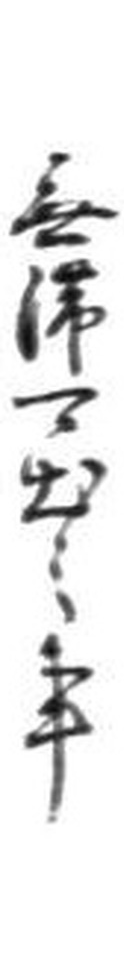無滞可出之事

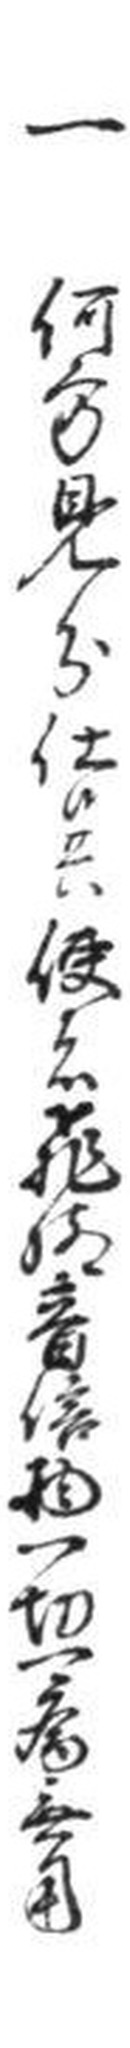一何方見分仕候共使者飛脚音信物一切可為無用
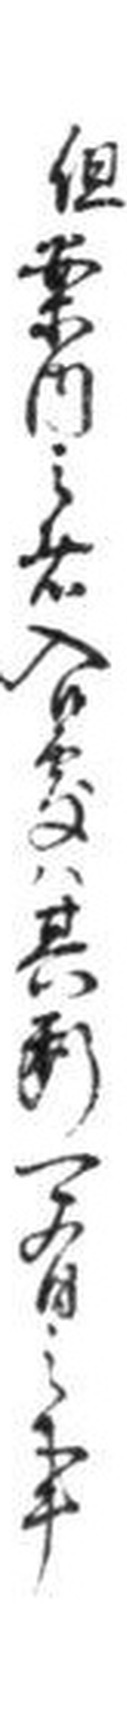但案内之者入候処ハ其断可有之事
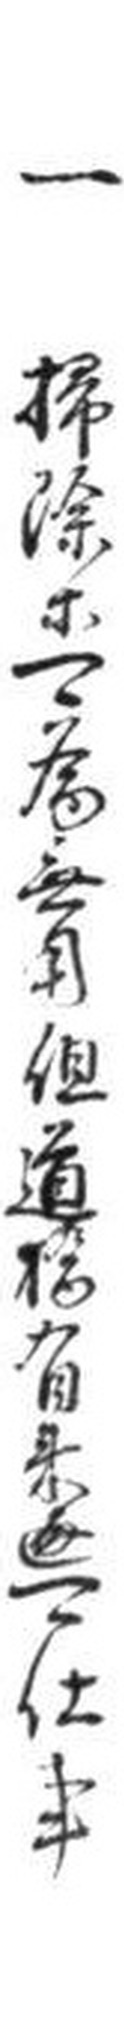一掃除等可為無用但道橋有来通可仕事
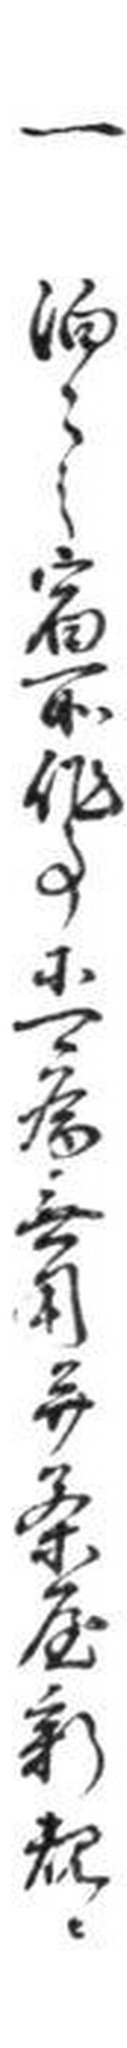一泊々之宿所作事等可為無用并茶屋新規ニ
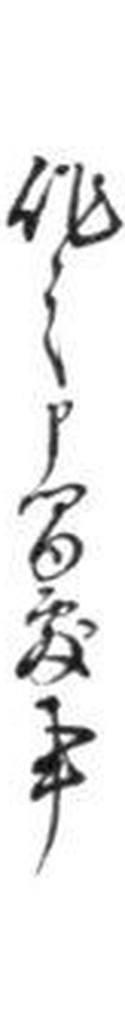作之申間敷事
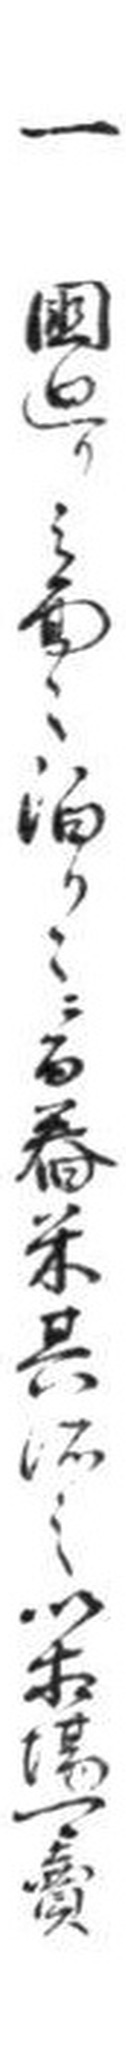一国廻リ之面々泊リ〳〵ニ而舂米其所之以相場可売
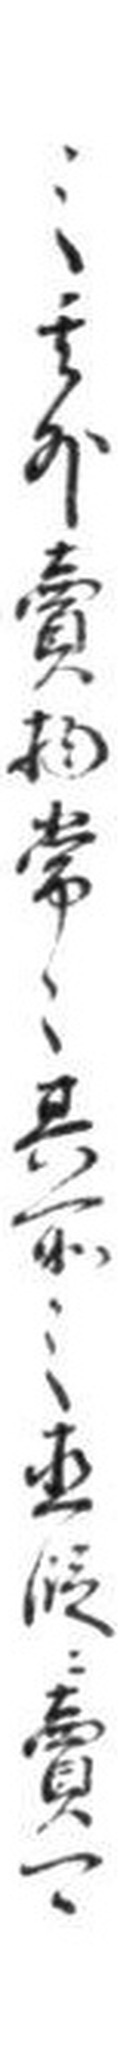之其外売物常々其所之直段ニ売可
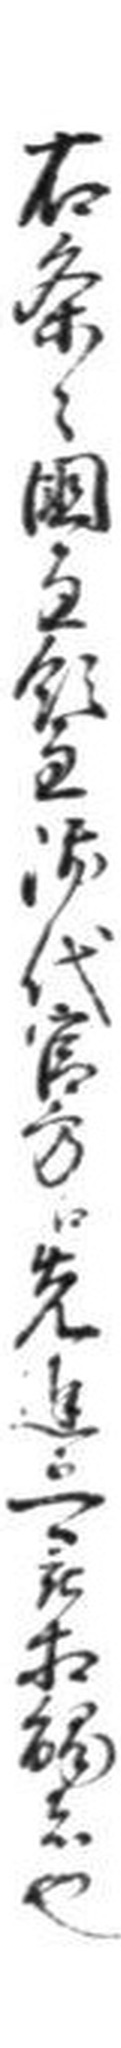右条々国主領主御代官江先達而可被相触者也
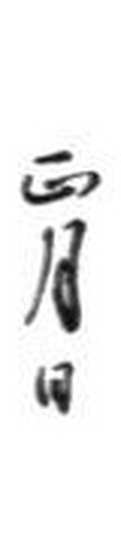正月日
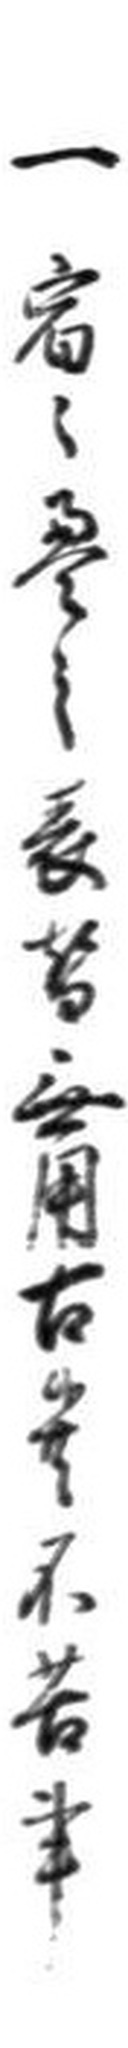一宿々畳之表替無用古候共不苦事
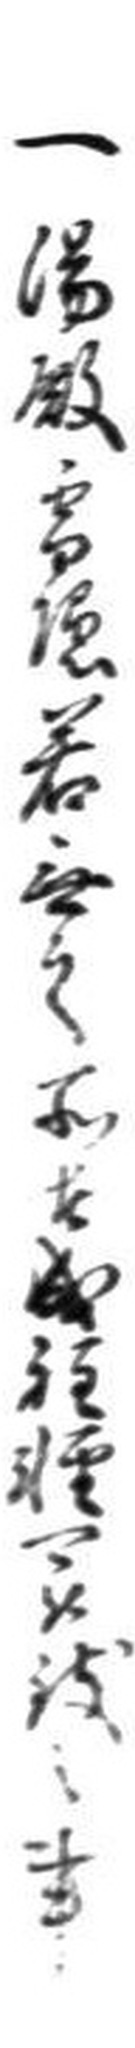一湯殿雪隠若無之所者成程軽可被致之事
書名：家譜 十五 綱昌公 従天和元年到元禄十二年
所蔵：福井県文書館 Fukui Prefectural Archives
